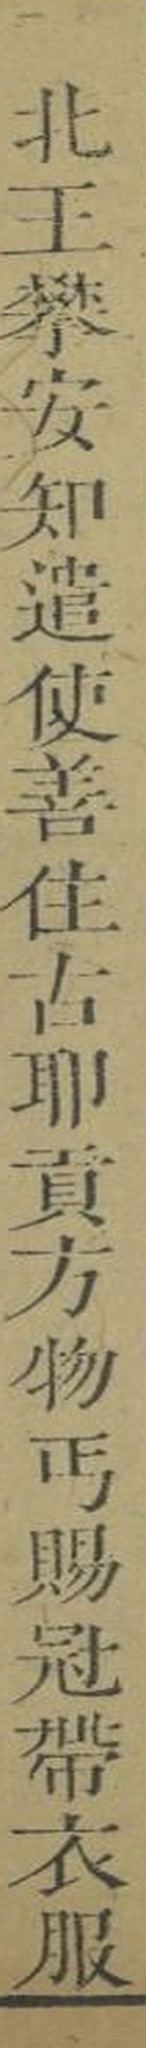北王攀安知遣使善住古耶貢方物丐賜冠帯衣服
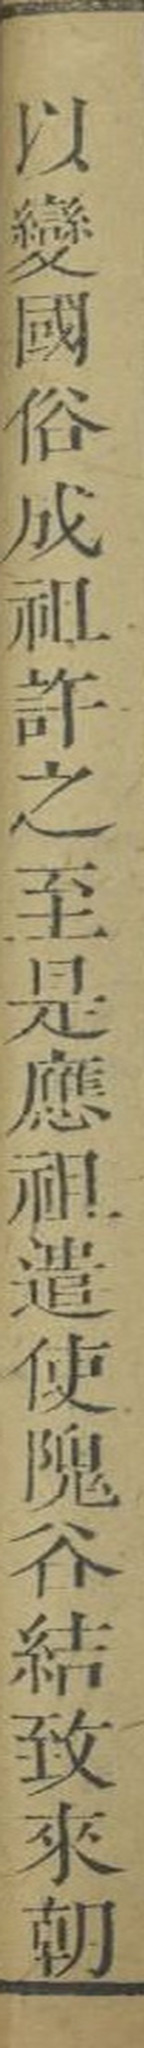以変国俗成祖許之至是応祖遣使隗谷結致来朝
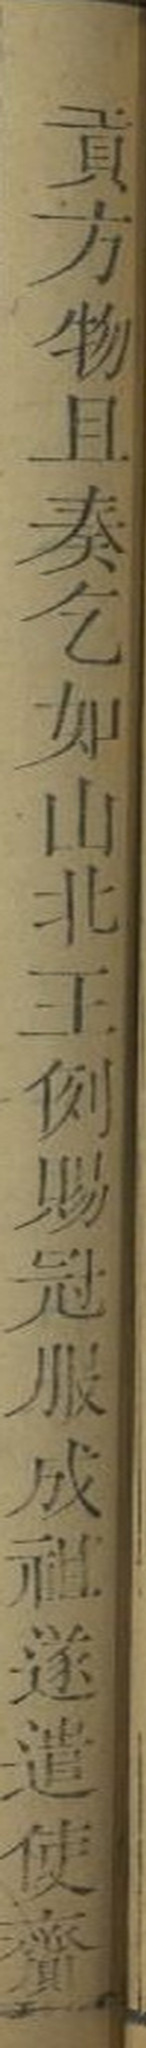貢方物且奏乞如山北王例賜冠服成祖遂遣使齎
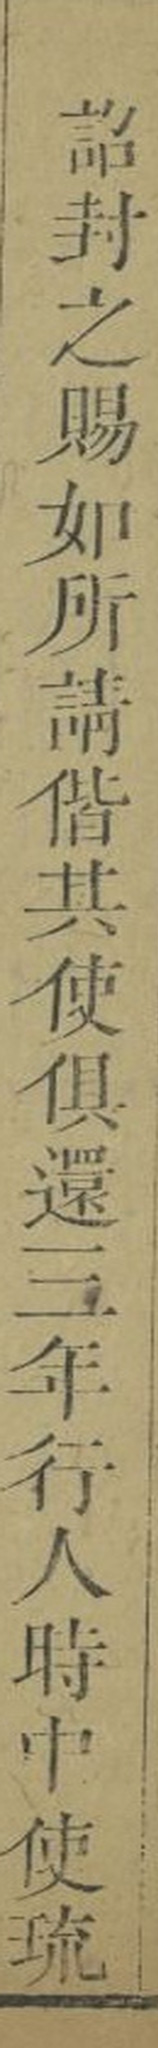詔封之賜如所請偕其使俱還三年行人時中使琉
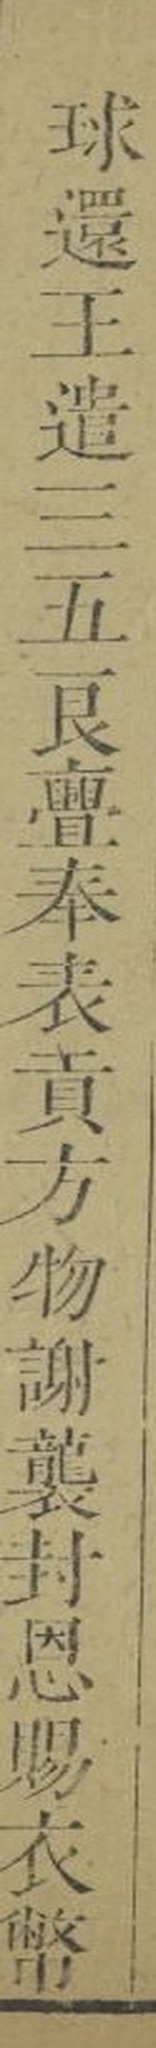球還王遣三五良亹奉表貢方物謝襲封恩賜衣幣
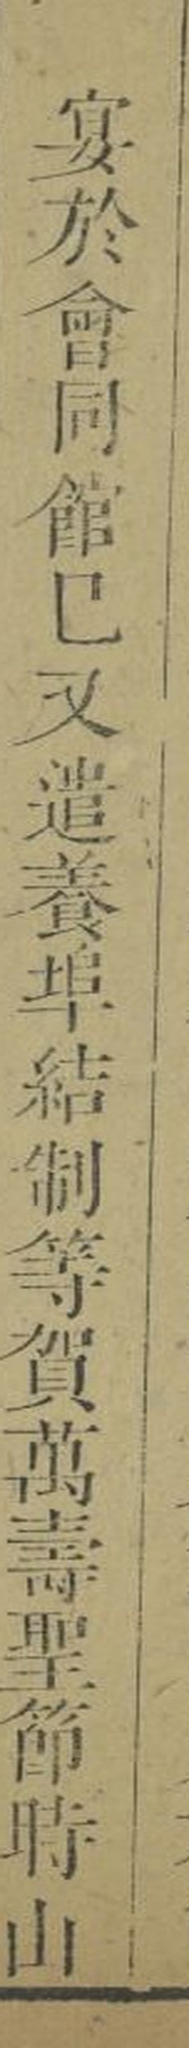宴於会同館巳又遣養埠結制等賀万寿聖節時山
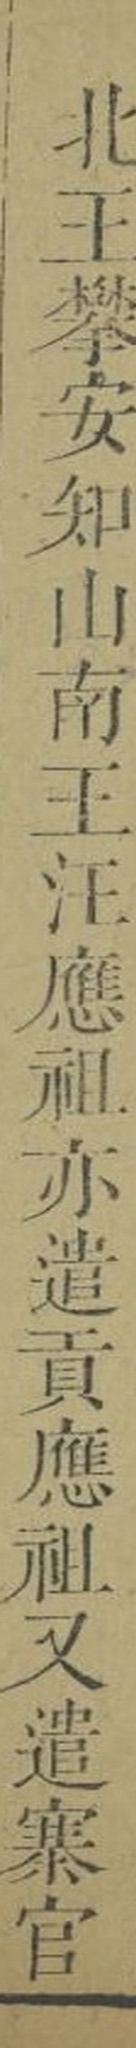北王攀安知山南王汪応祖亦遣貢応祖又遣寨官
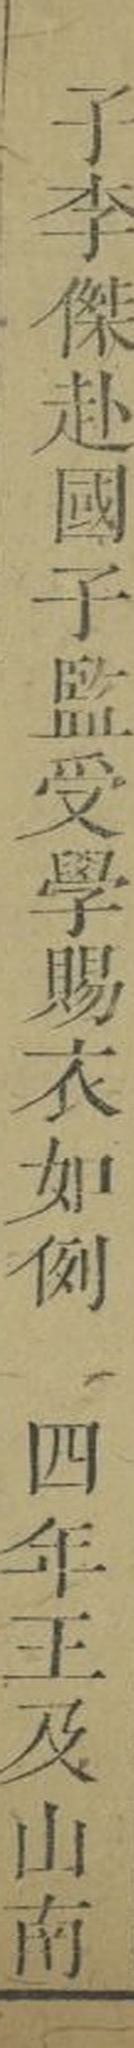子李傑赴国子監受学賜衣如例四年王及山南
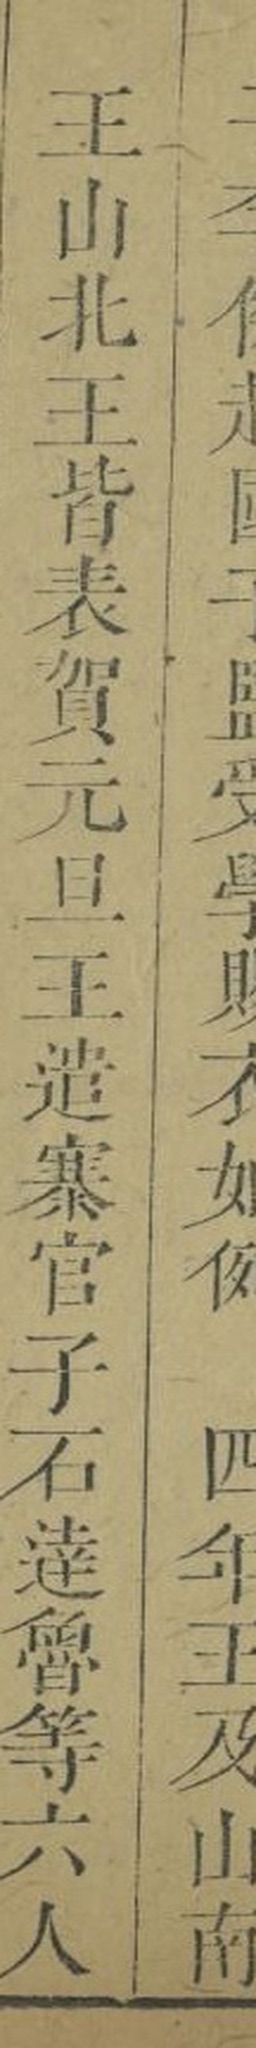王山北王皆表賀元旦王遣寨官子石達魯等六人
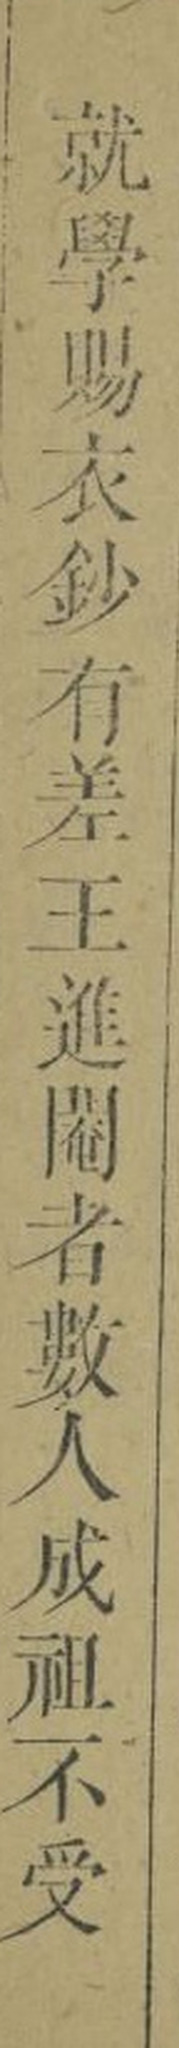就学賜衣鈔有差王進閹者数人成祖不受
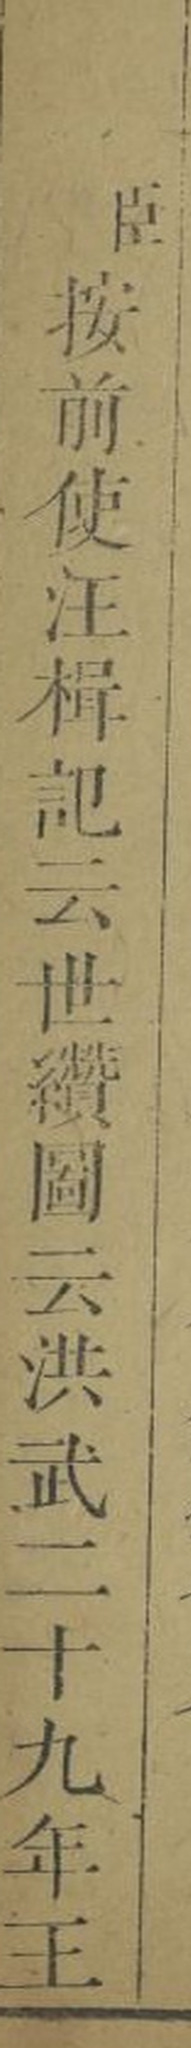臣按前使汪楫記云世纘図云洪武二十九年王

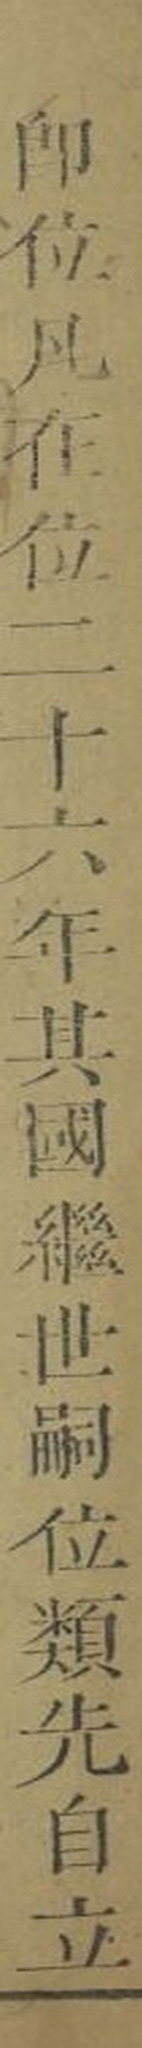即位凡在位二十六年其国継世嗣位類先自立
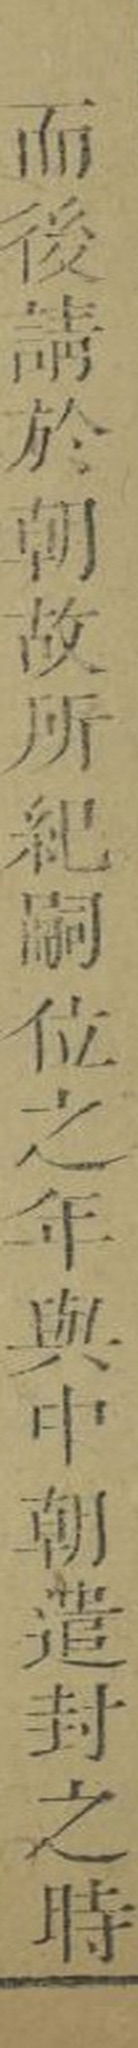而後請於朝故所紀嗣位之年与中朝遣封之時
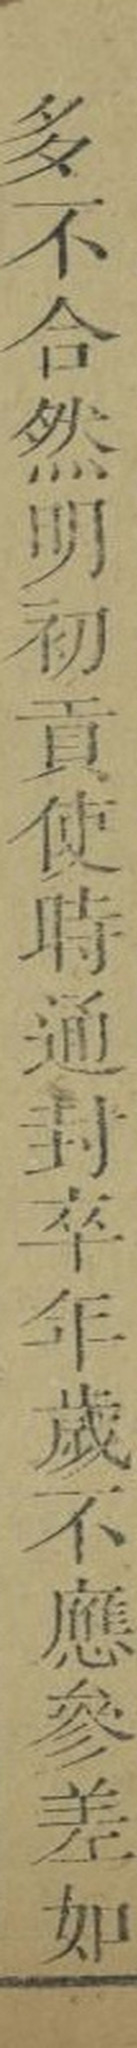多不合然明初貢使時通封卒年歳不応参差如
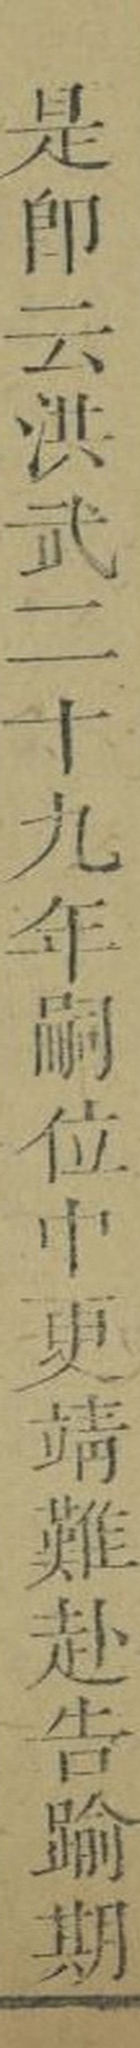是即云洪武二十九年嗣位中更靖難赴告踰期
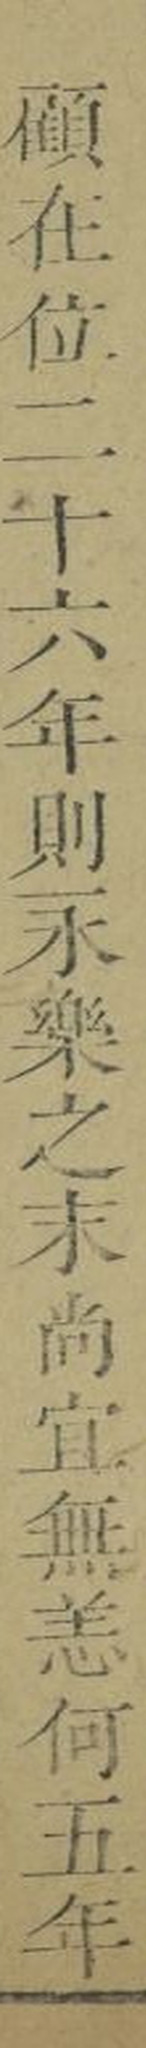顧在位二十六年則永楽之末尚宜無恙何五年
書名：中山伝信録 巻三
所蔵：University of the Ryukyus Library
